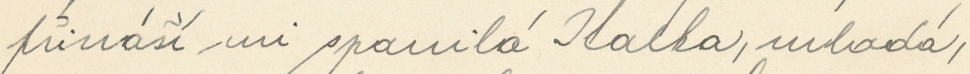přináší mi spanilá Italka, mladá,
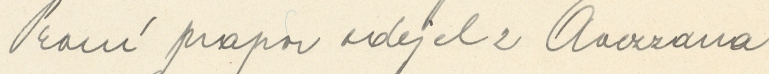První prapor odejel z Avezzana
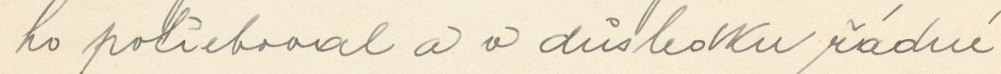ho potřeboval a v důsledku řádné
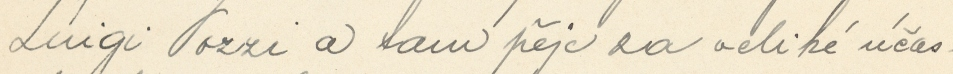Luigi Pozzi a tam pěje za veliké účas-
